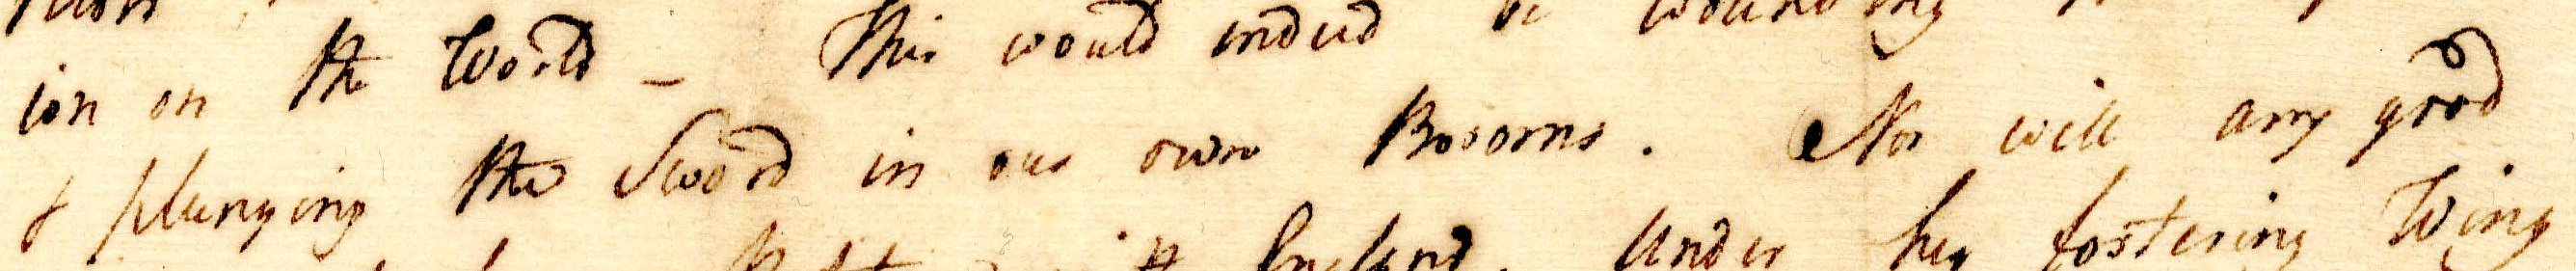& plunging the Sword in our own Bosoms. Nor will any good
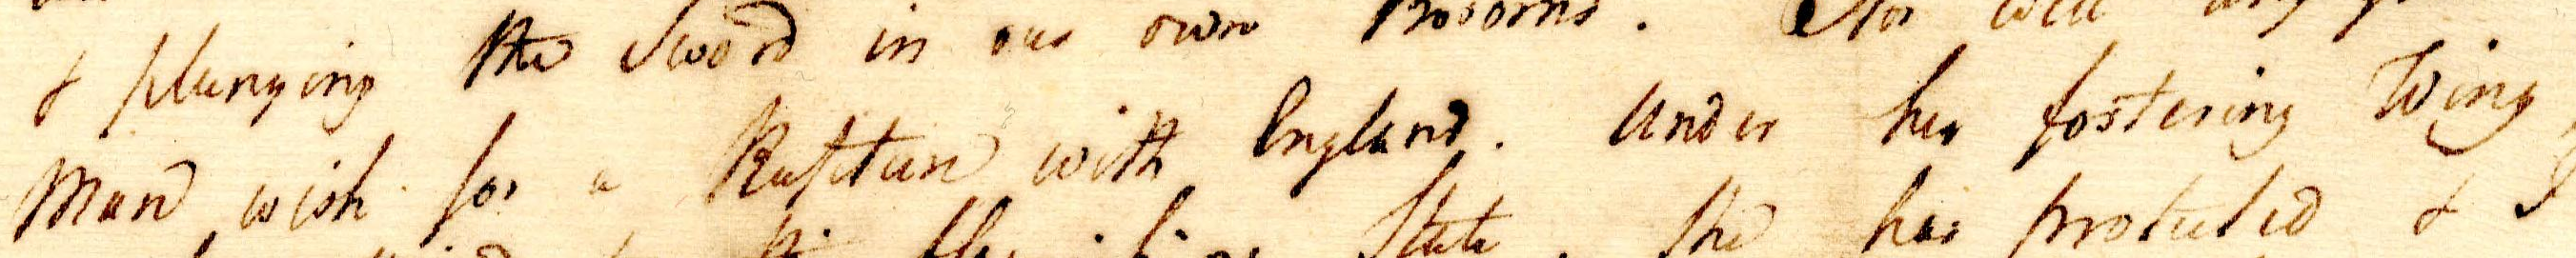Man wish for a Restitution with England. Under her fostering wing
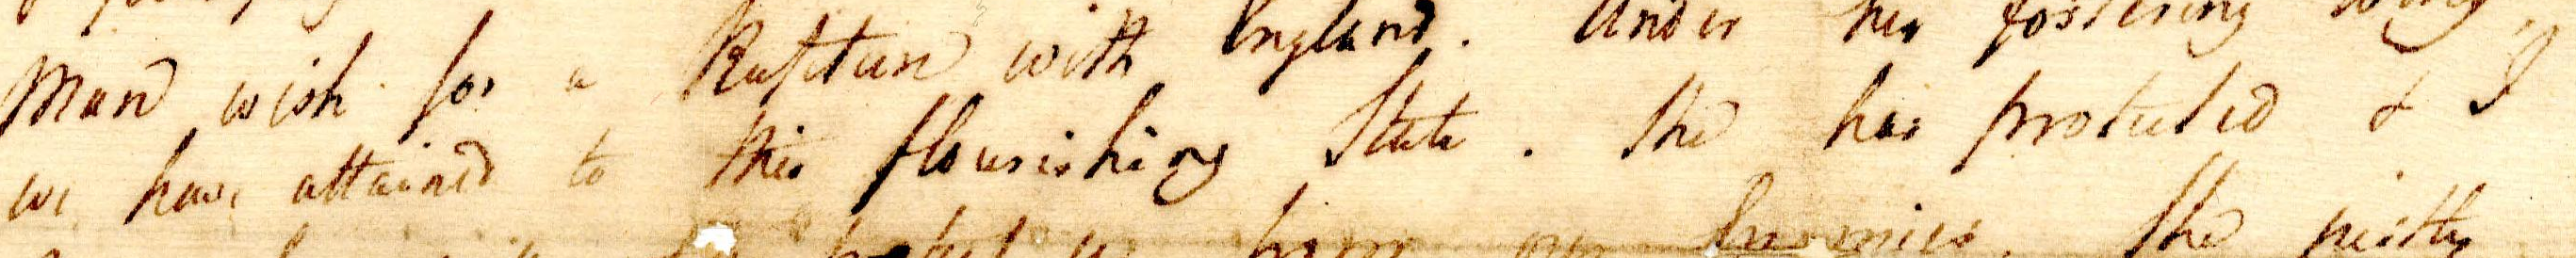we have attained to this flourishing State. She has protected & I
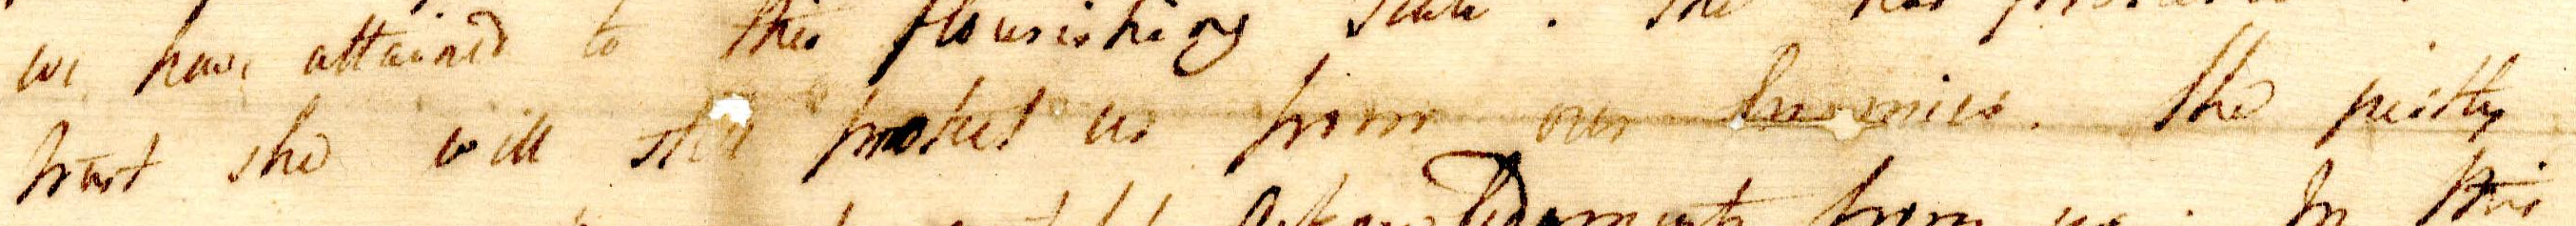trait she will still protect us from our Enemies.- She peitly
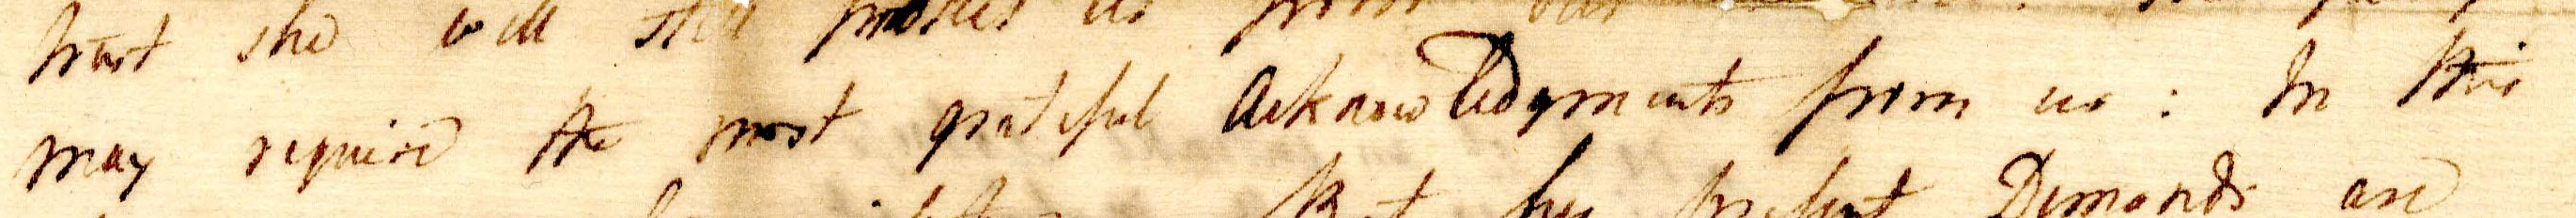may require to most grateful Acknowledgments from us. In this
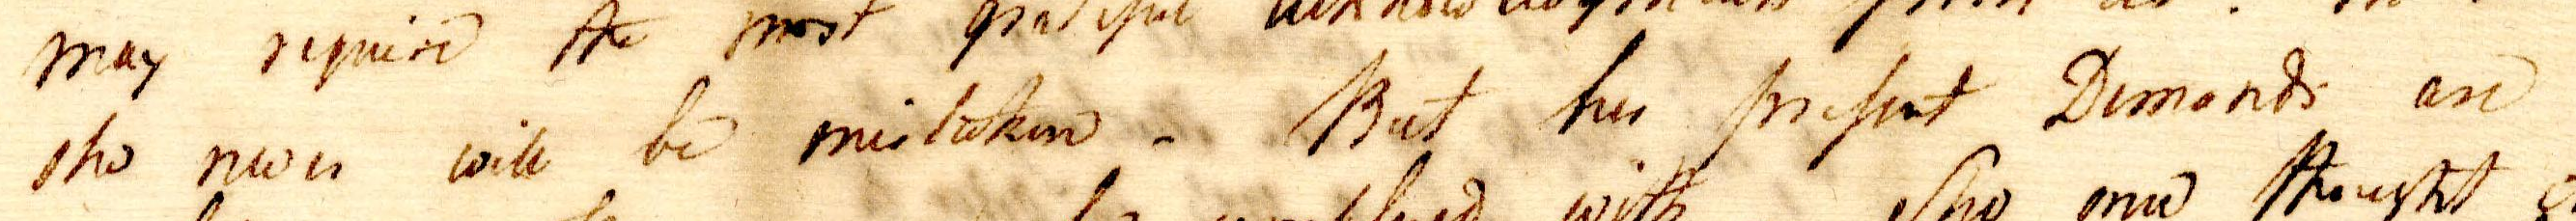she never will be mistaken. But his present Diamonds are
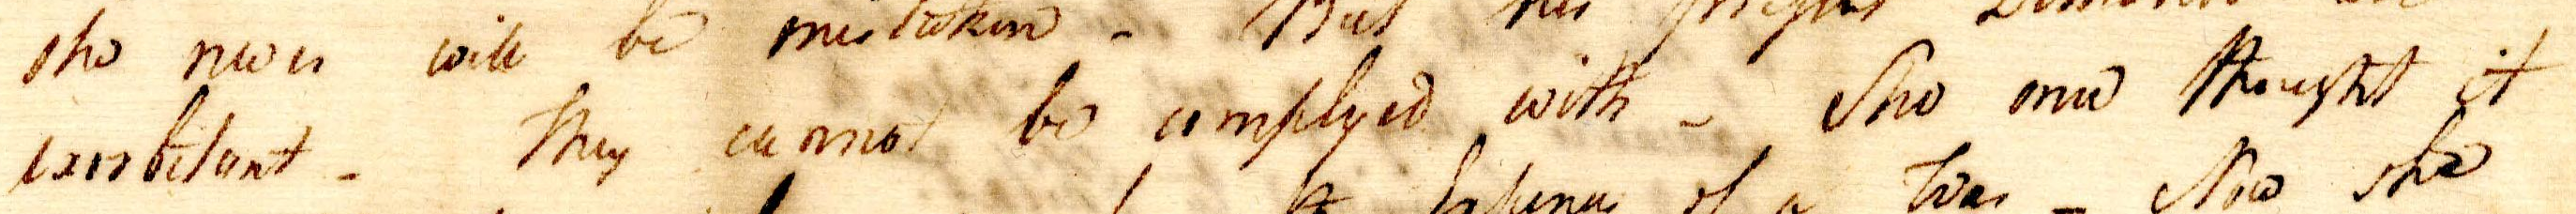exorbitant. They cannot be complyed with. She once thought it
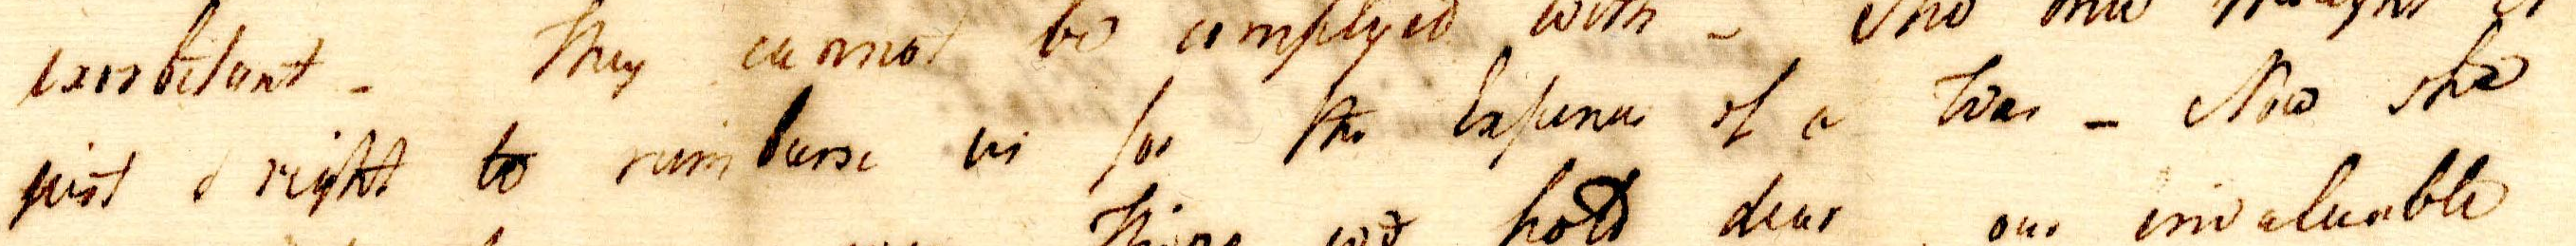fwist & right to reimburse us for the Expence of a War. Now she
